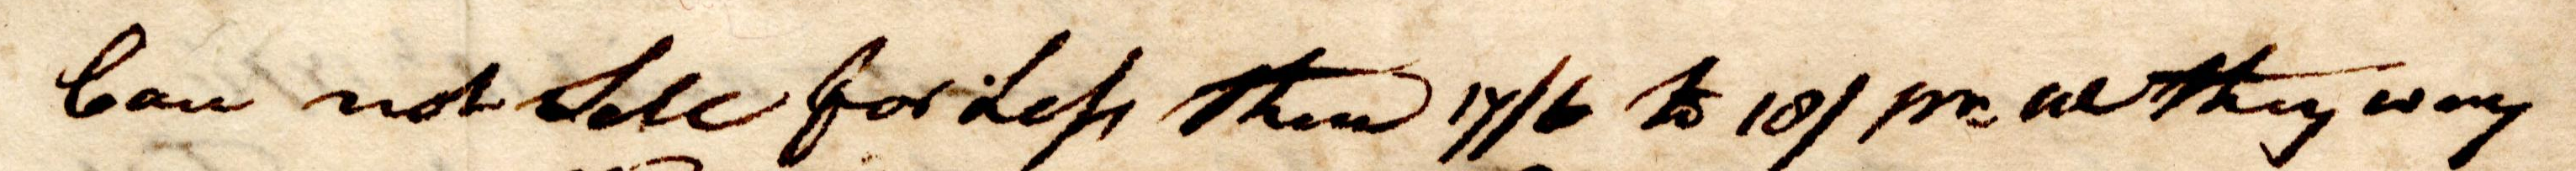Can not Sell for less then 17s6 15 10s per or they way
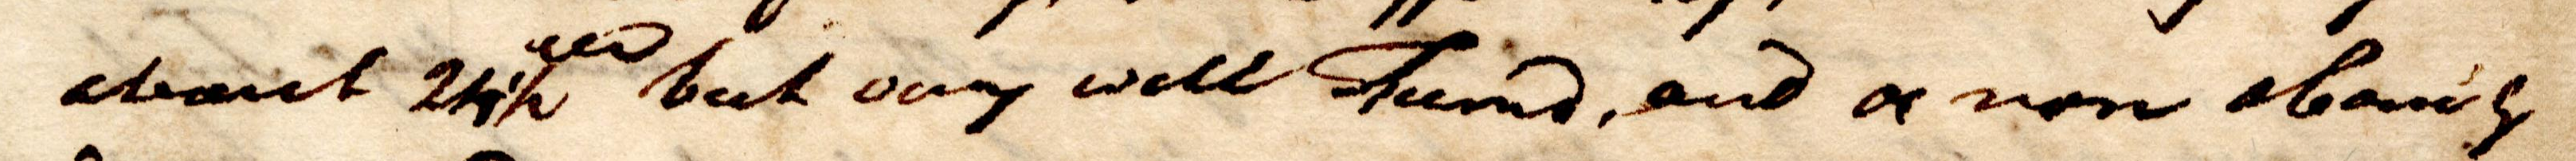about 24 1/2 ^ere but very well Fumd, and as none a Come'g
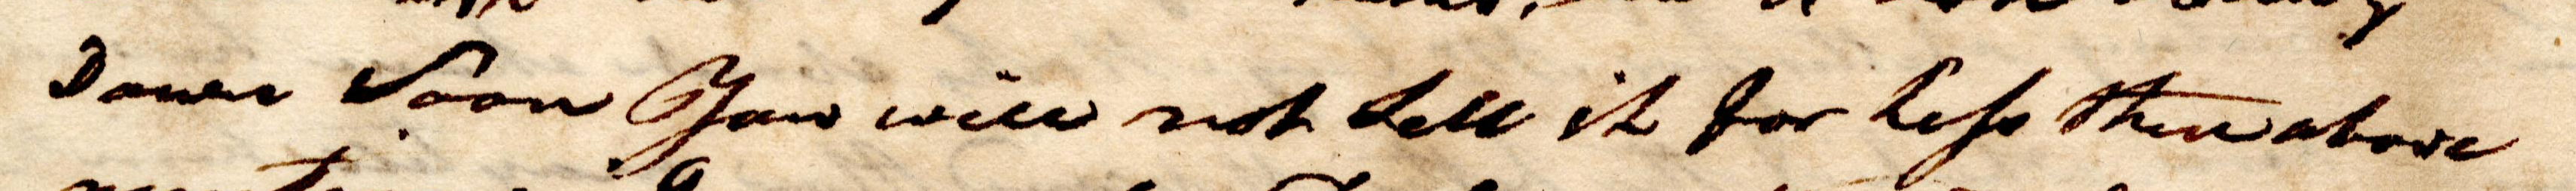Down soon you will not sell it for less then above
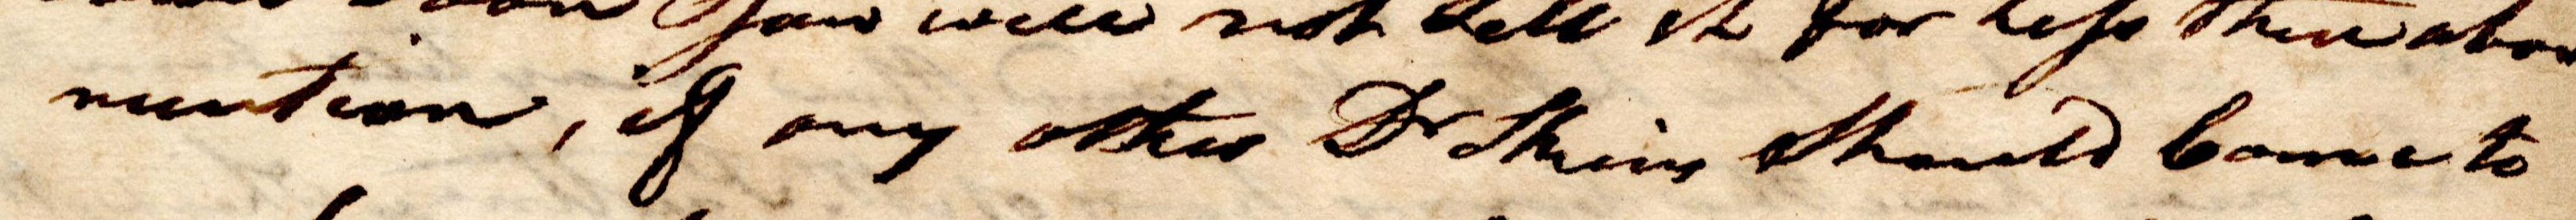mention, if my other D^r skins Should Come to
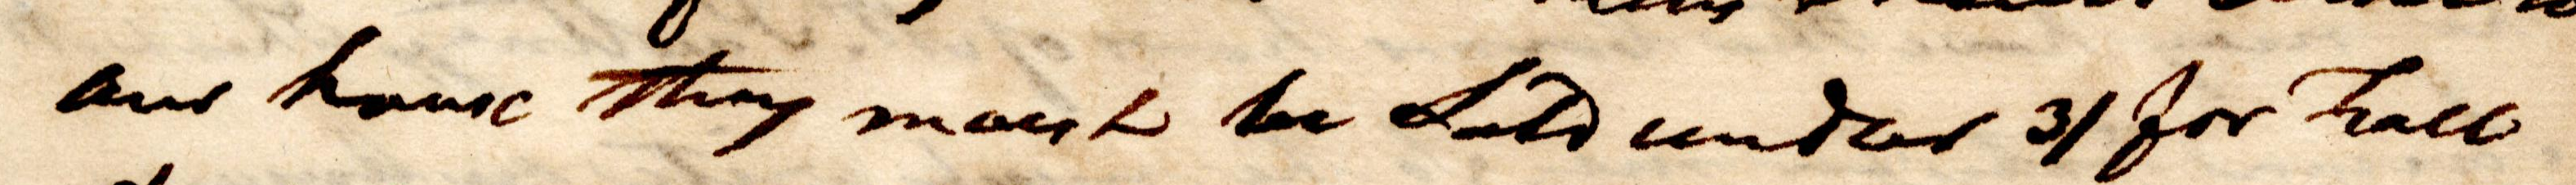our house they must be Sold under 3s for Fall
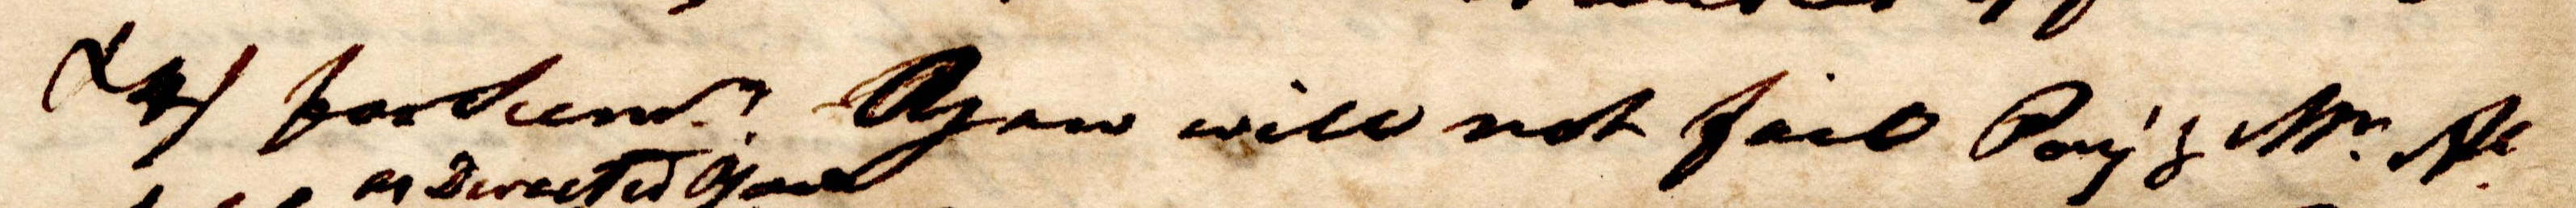& 4s for sum^r. You will not find fail Pay'g M^r. A
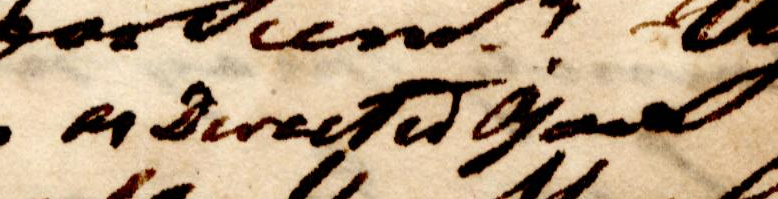as Directed you
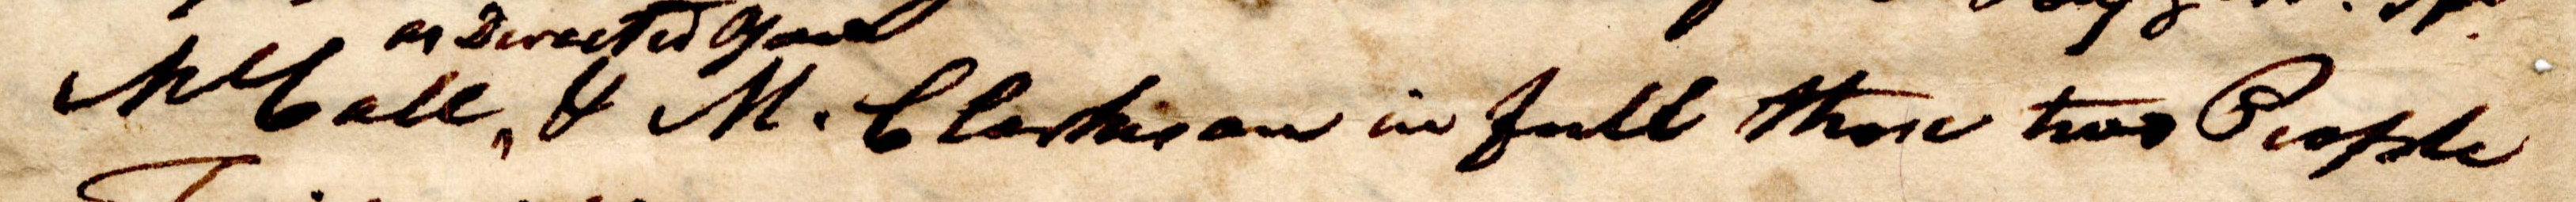M^cCall ^ & M. Clarkson in full those two People
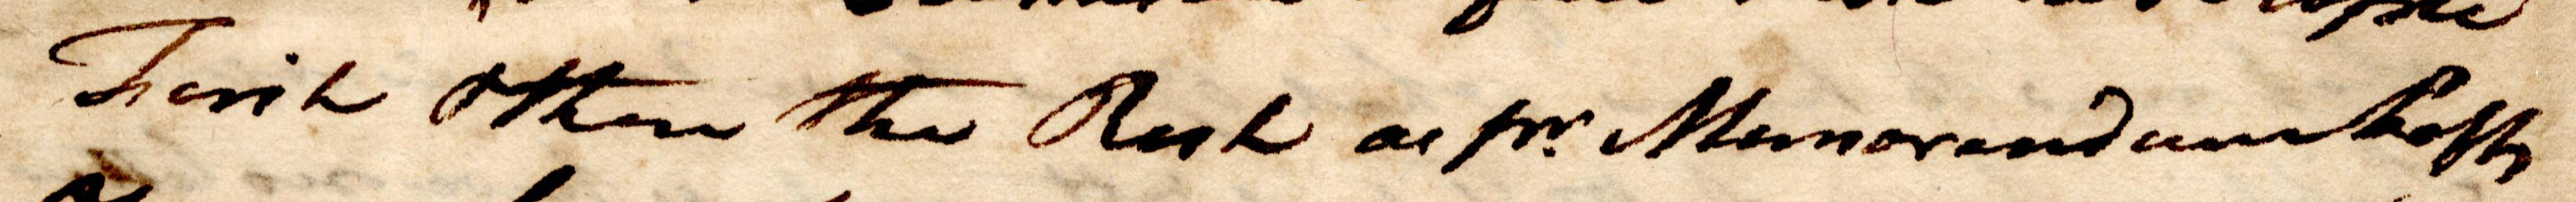First & then the Rest as p^r. Memorandum Lest
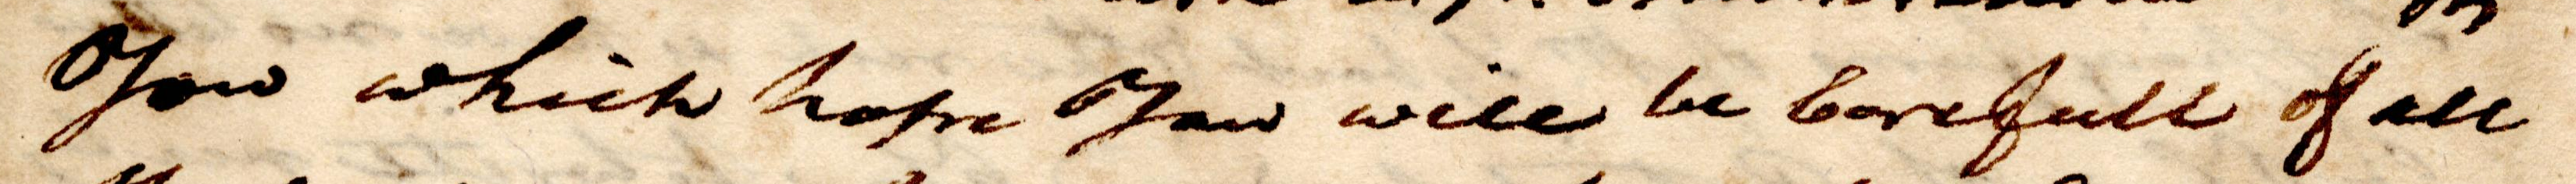You which hope you will be carefull of all
